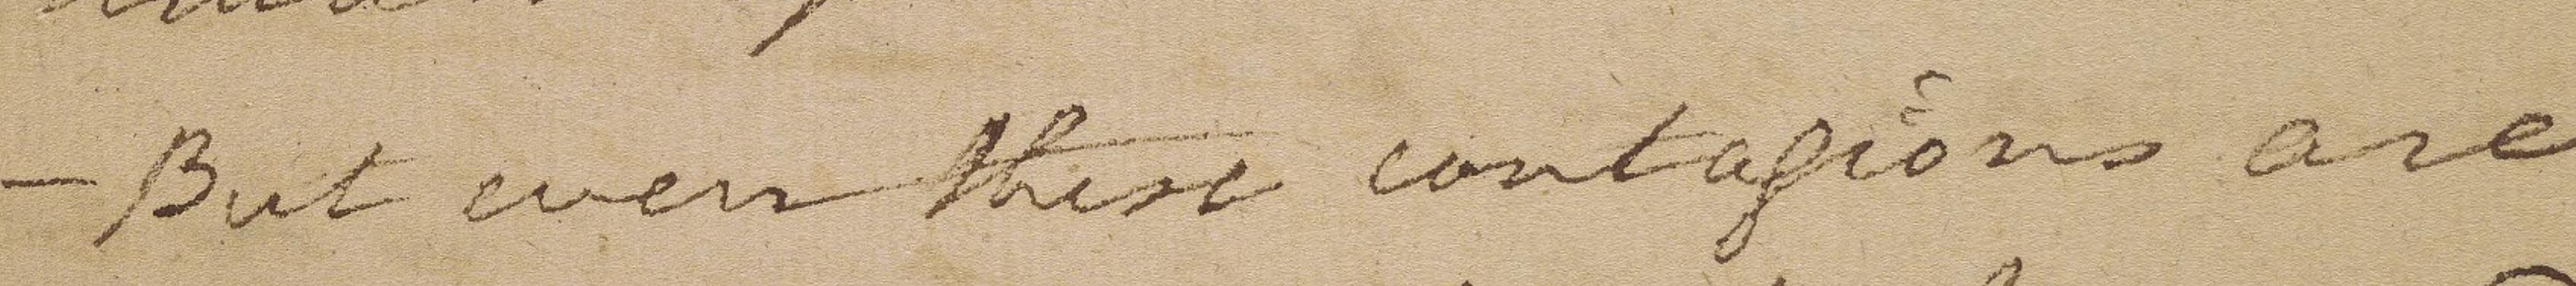But even there contagions are
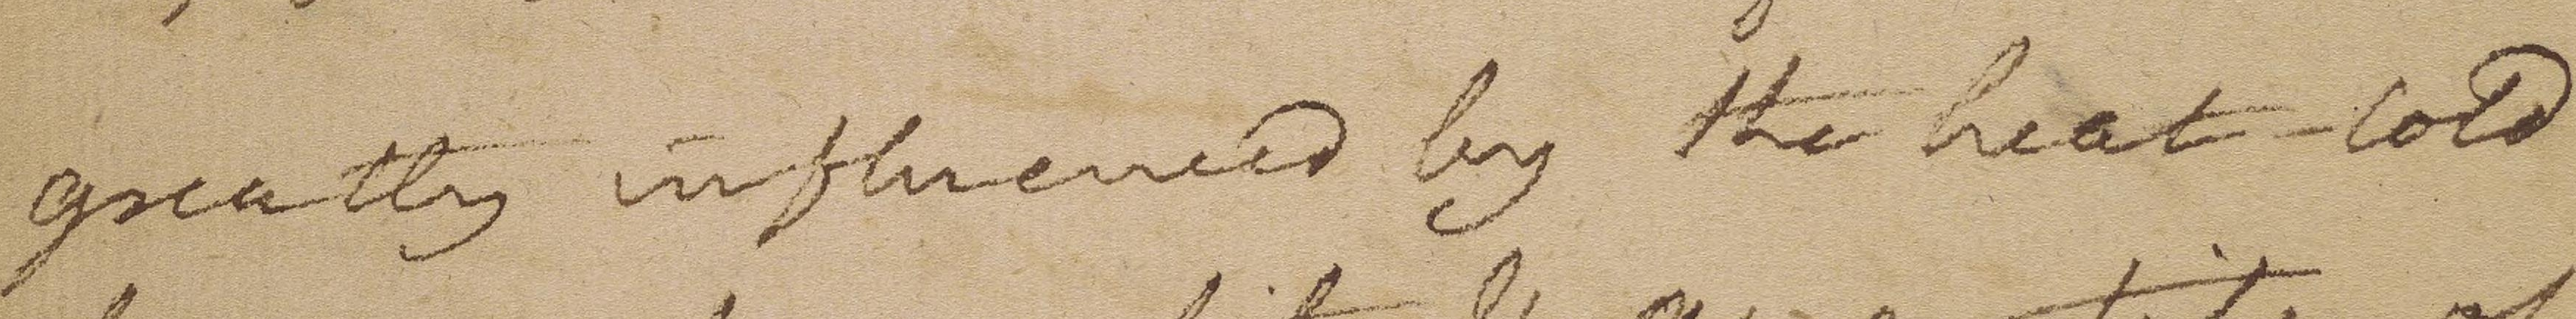greatly influenced by the heat, cold
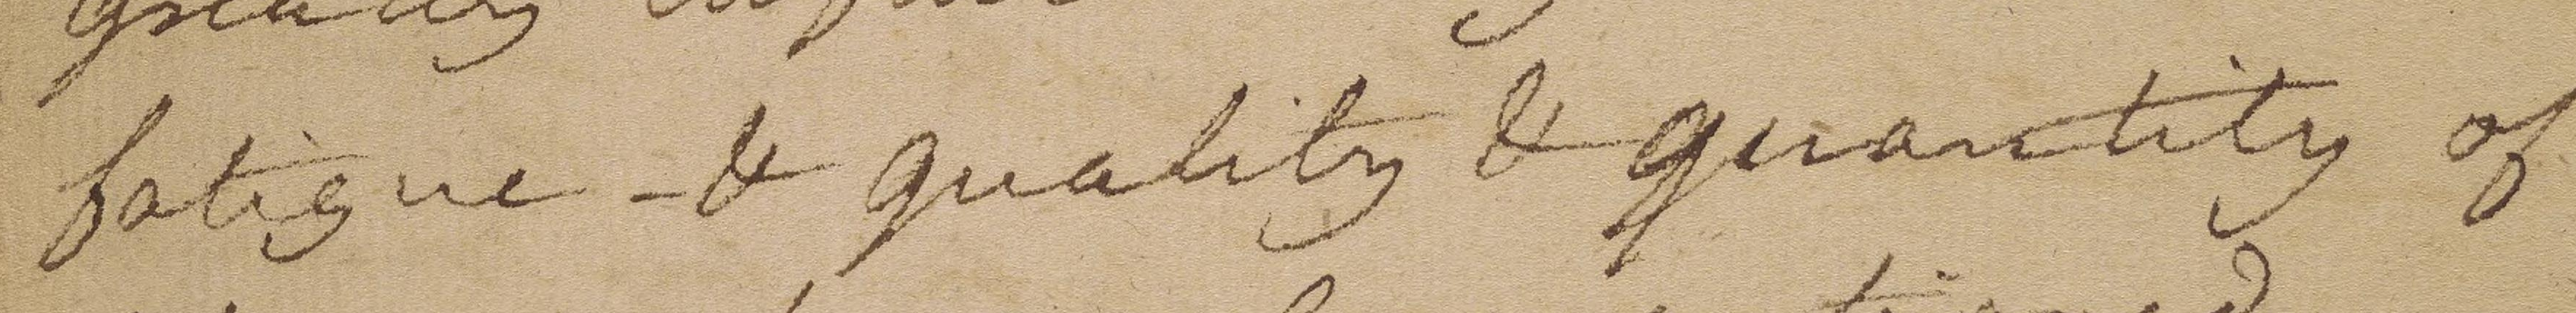fatigue, & quality & quantity of
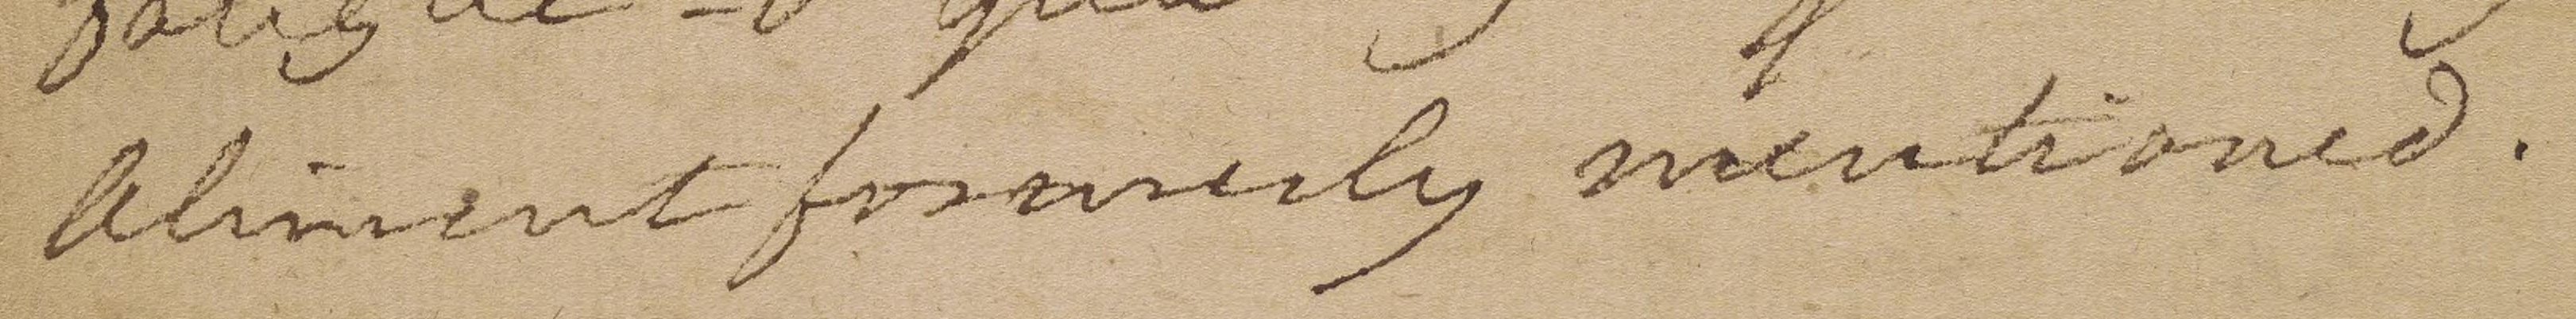aliment formerly mentioned.
